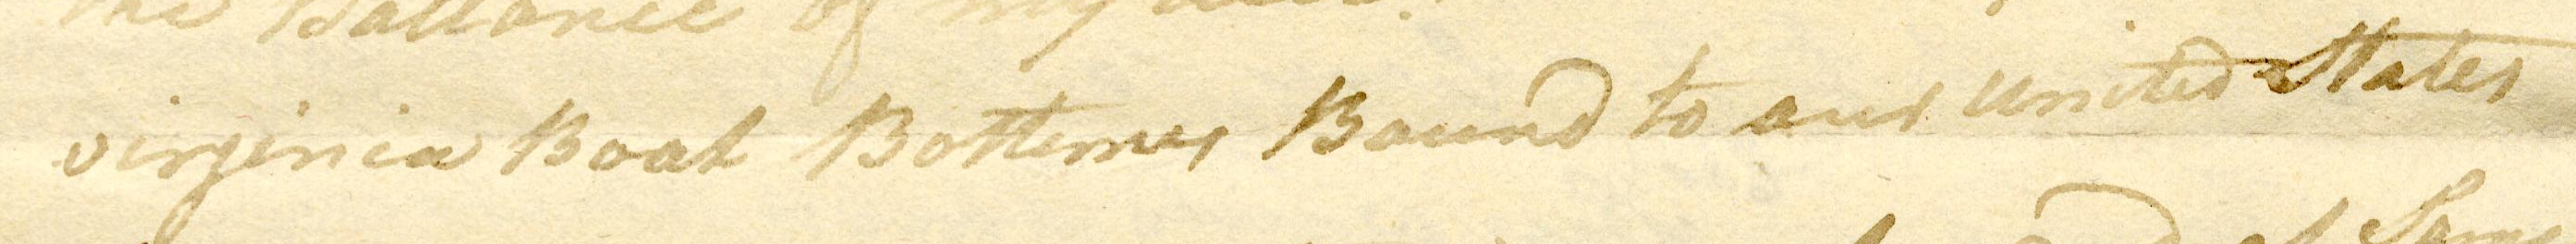Virginia Boat Bottomes Bound to acc^t United States
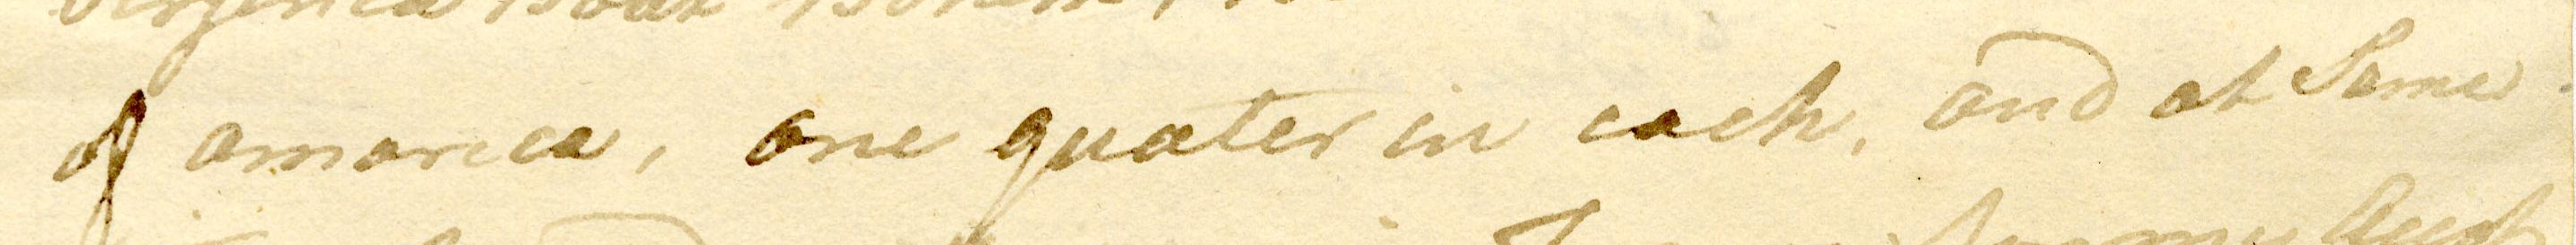of amoarica, one quater in each, and at some
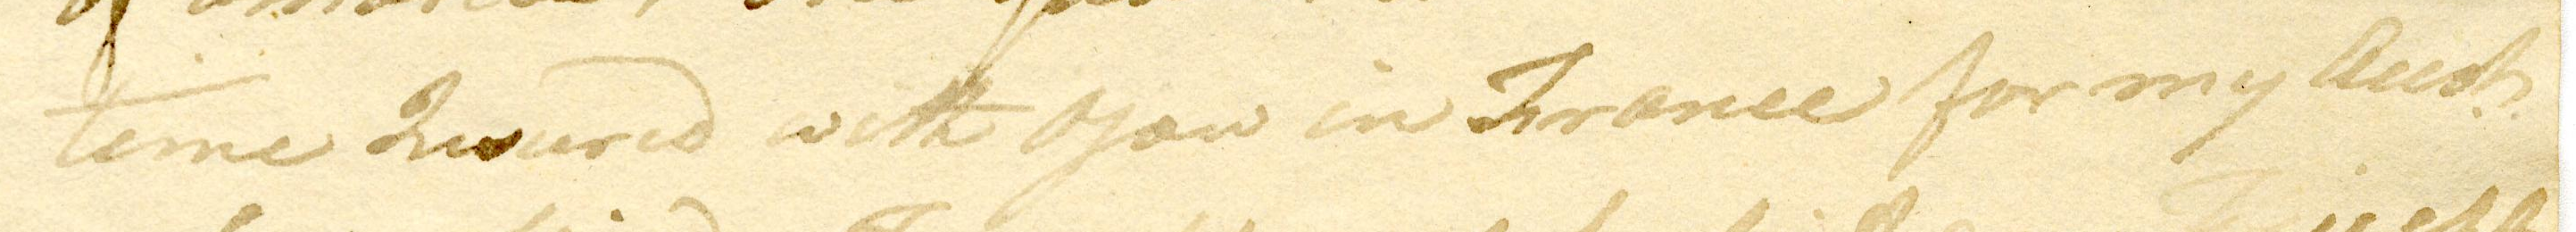time Insured with you in France for my acc^t
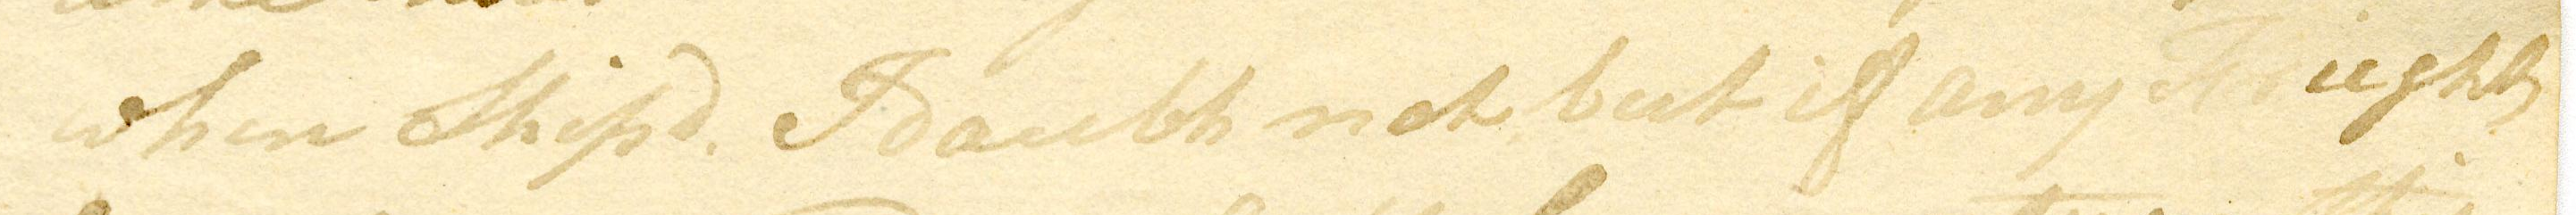when Ship^d. I doubt not but if any freight
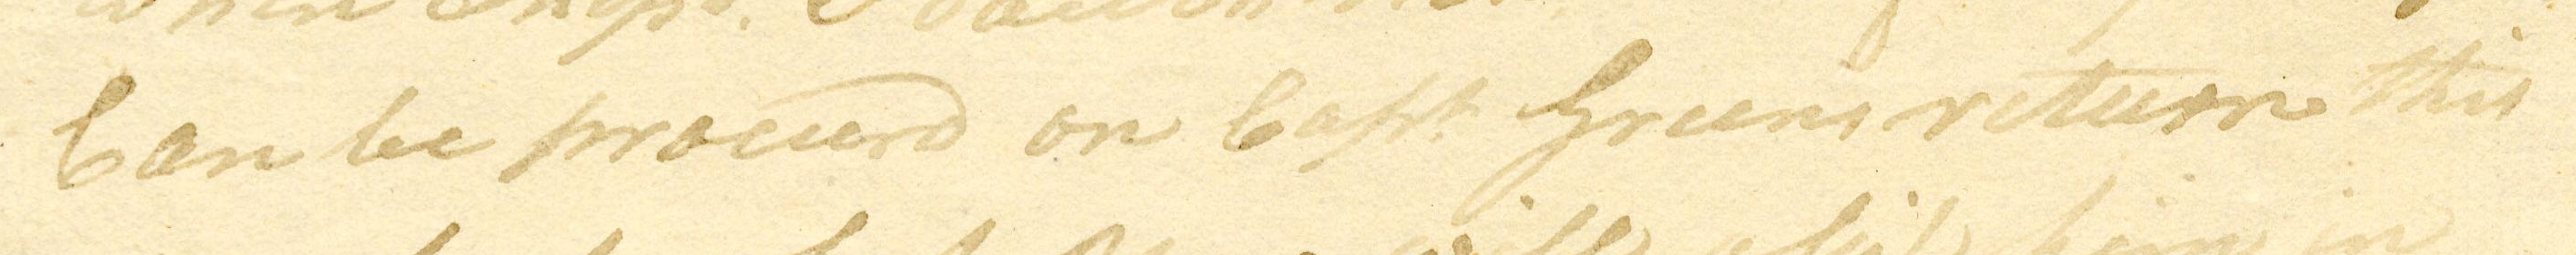Can be procurd on Cap^t. Greens return this
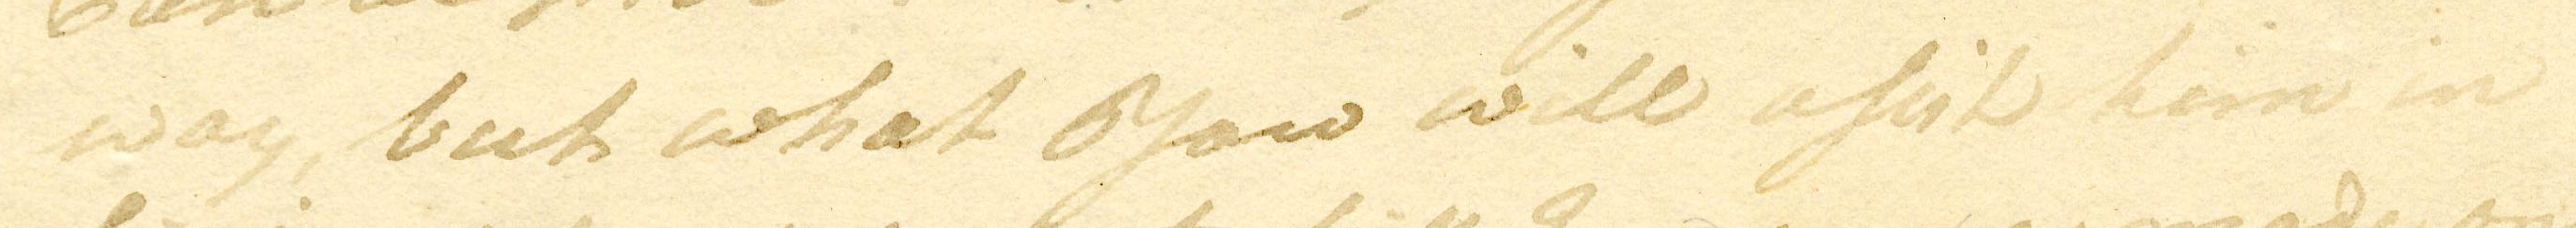way but what you will asist him in
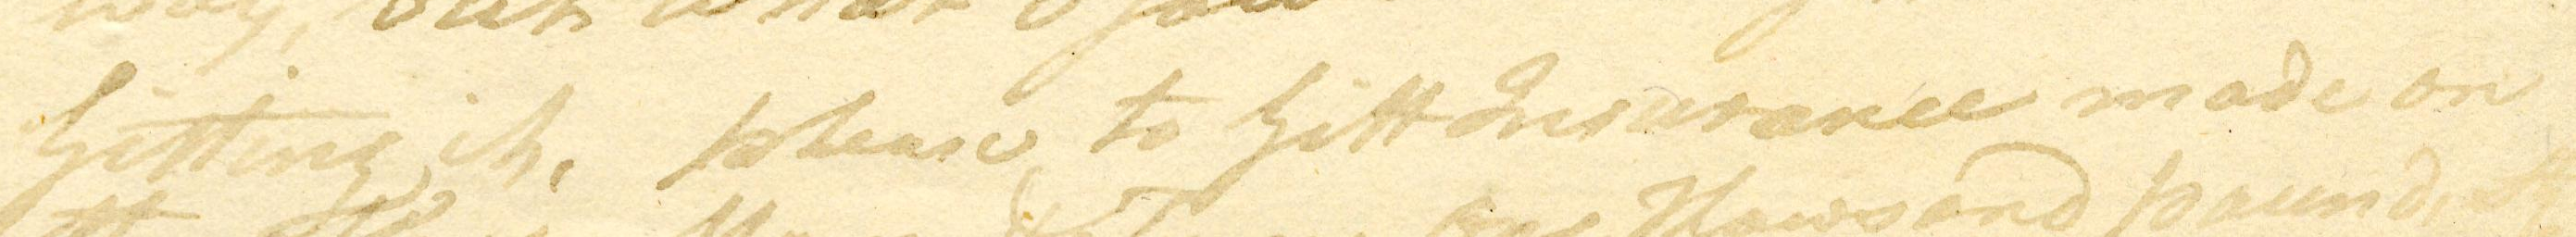Getting it, please to Gitt Insurance made on
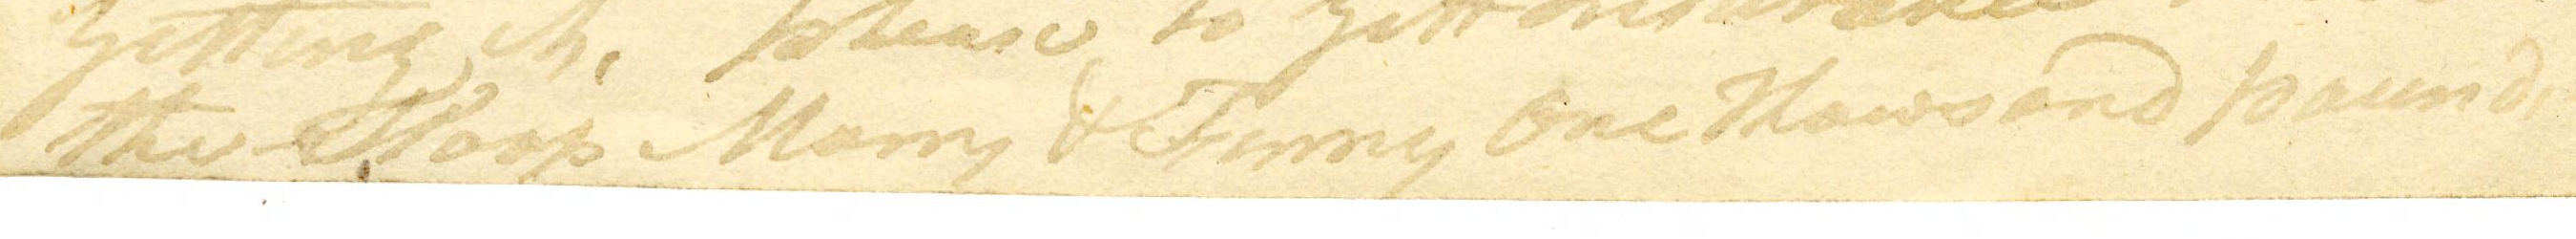the Sloop Marry & Fanny One thousand pounds
